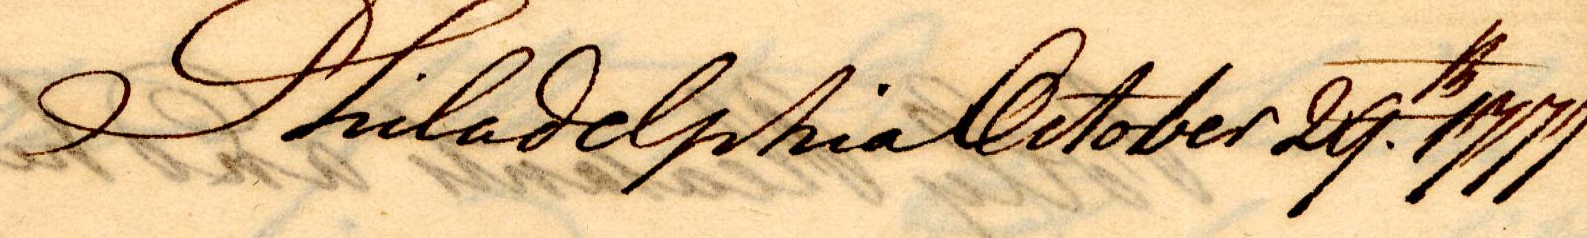Philadelphia October 29^th 1777
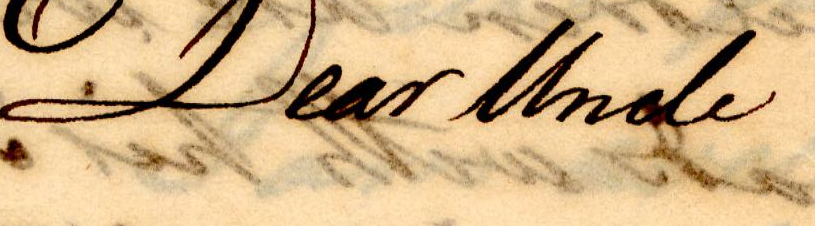Dear Uncle
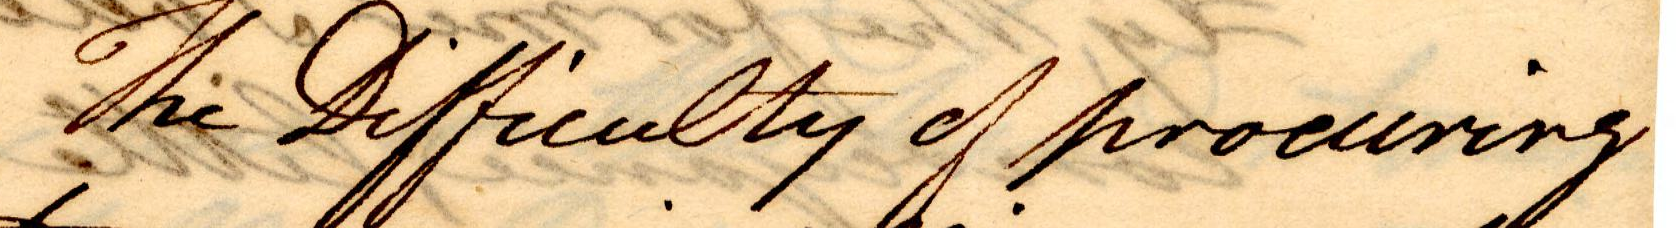The Difficulty of procuring
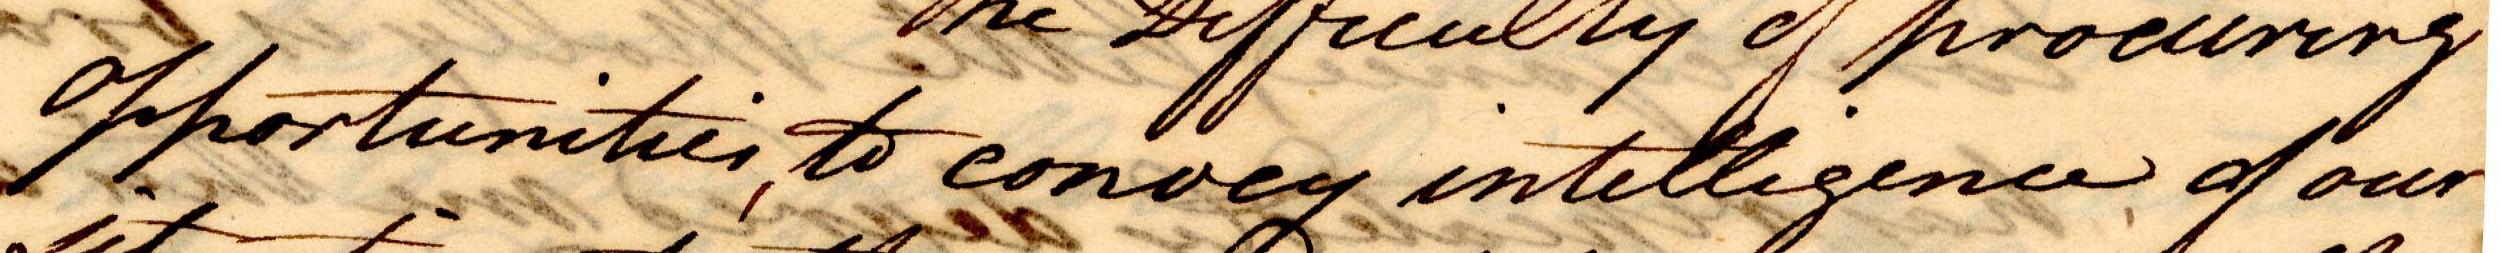opportunities, to convey intelligence of our
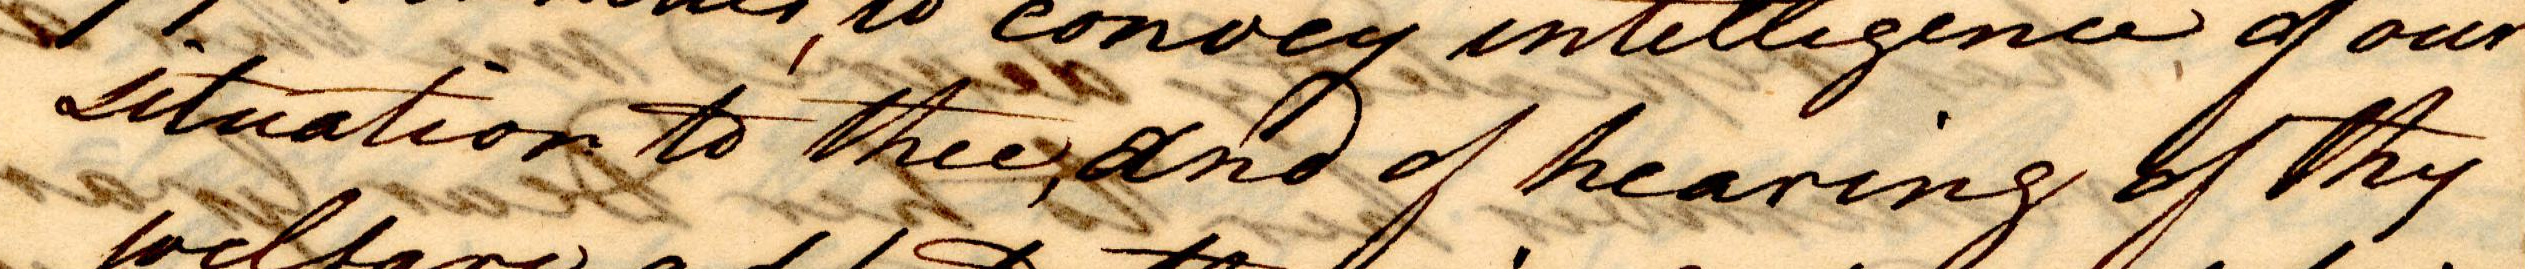situation to thee, and of hearing of thy
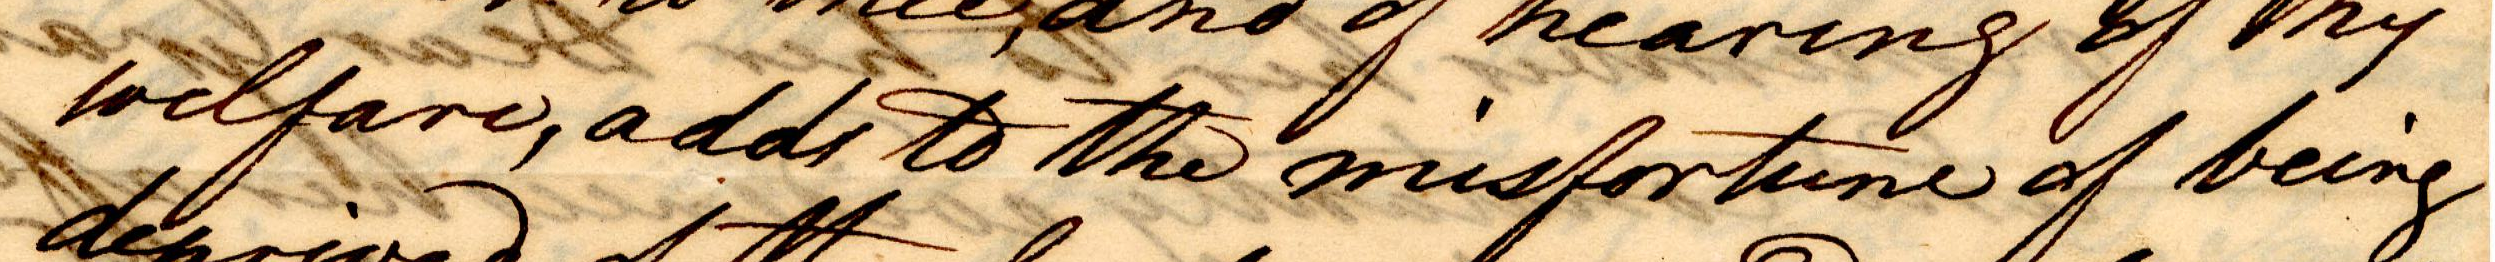welfare, adds to the misfortune of being
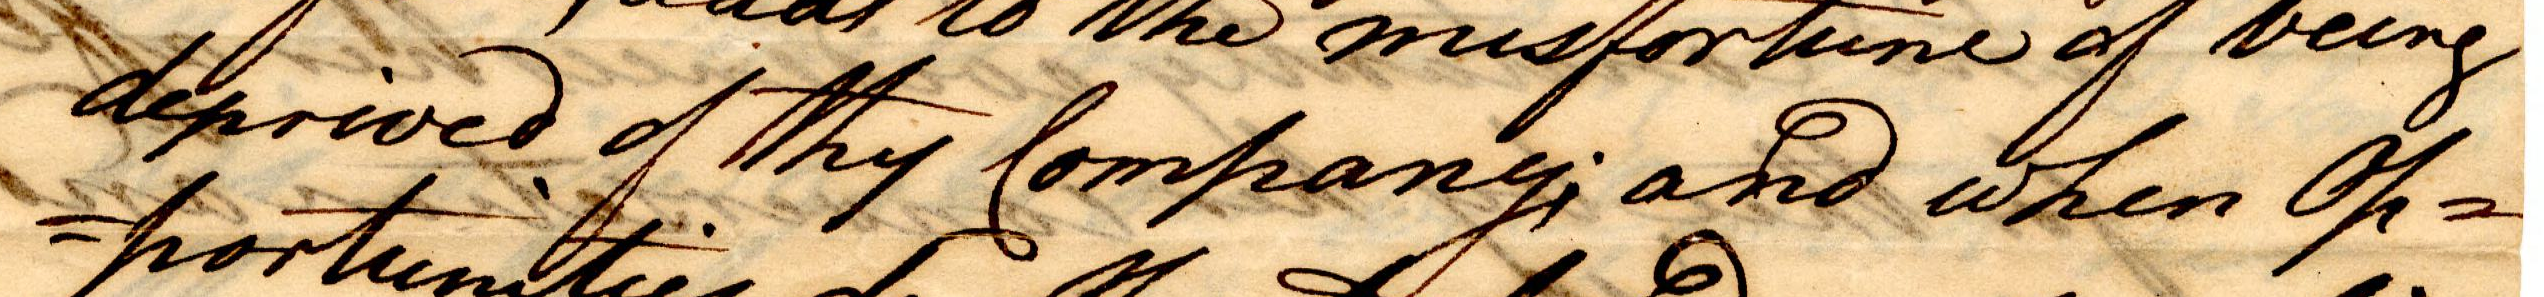deprived of thy Company; and when Op-
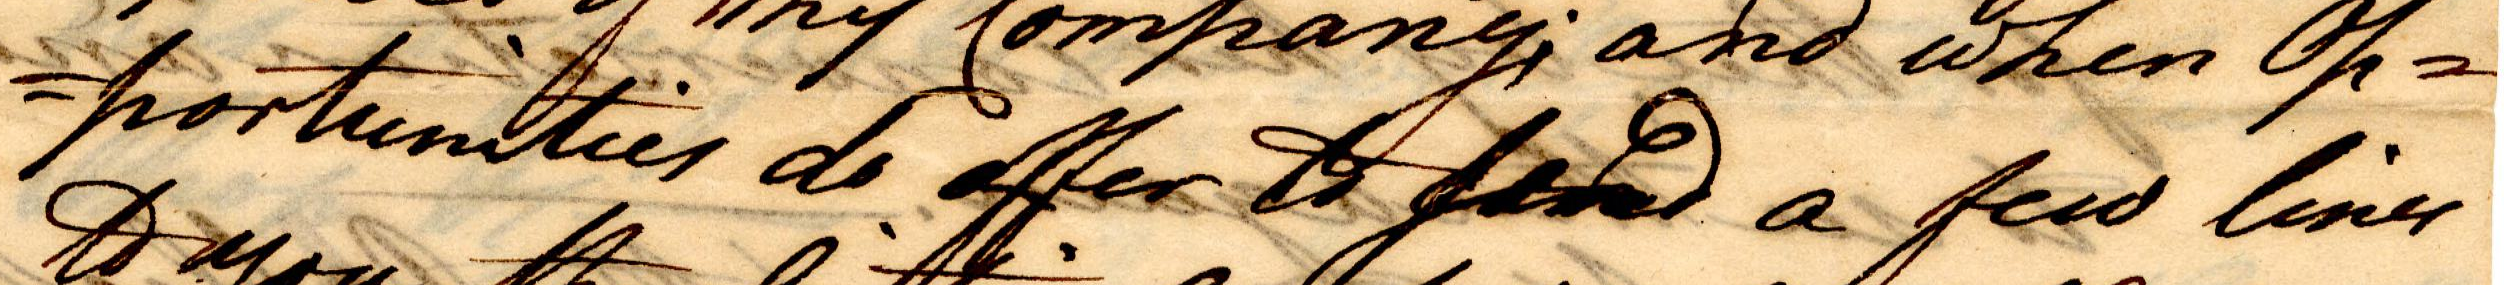-portunities do offer to send a few lines
